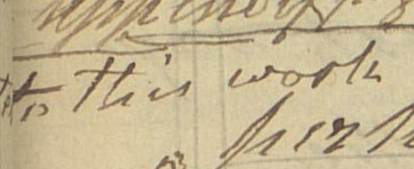to this work
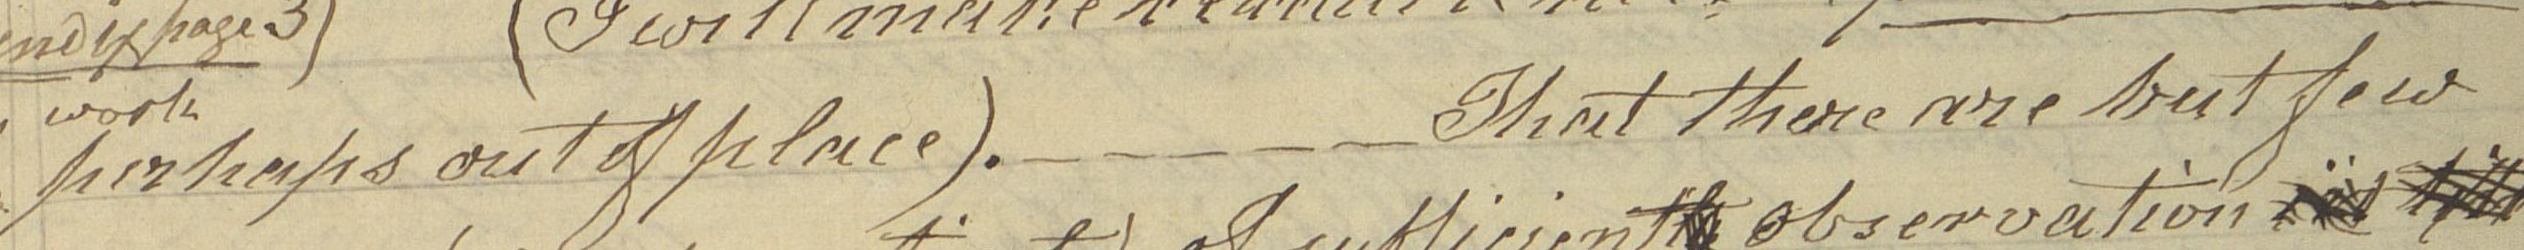perhaps out of place). That there are but few
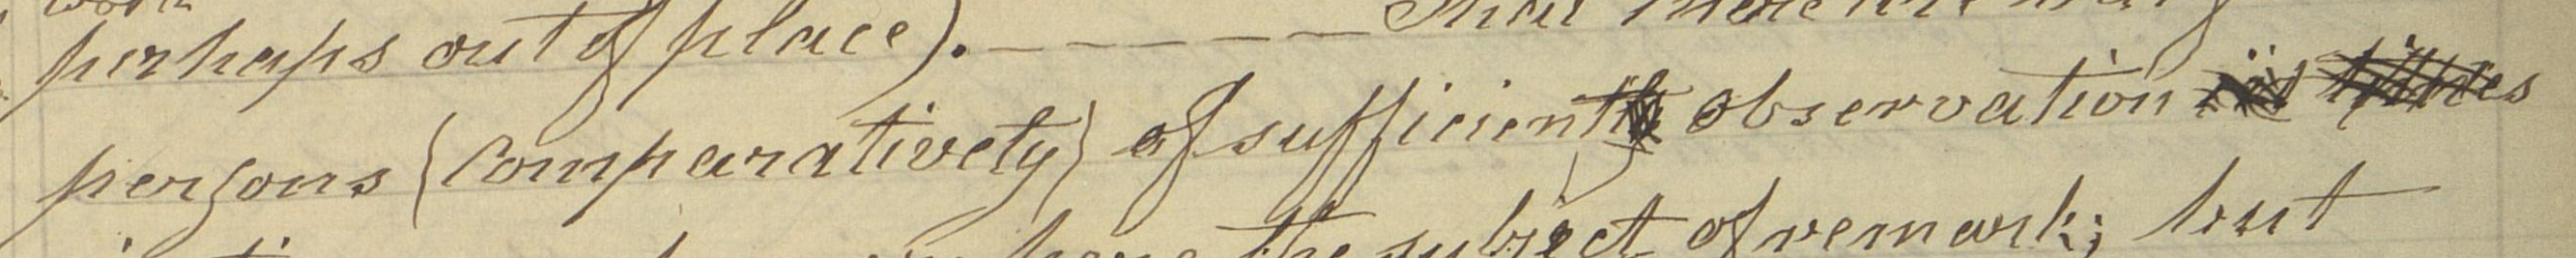persons (comparatively) of sufficient observation at times
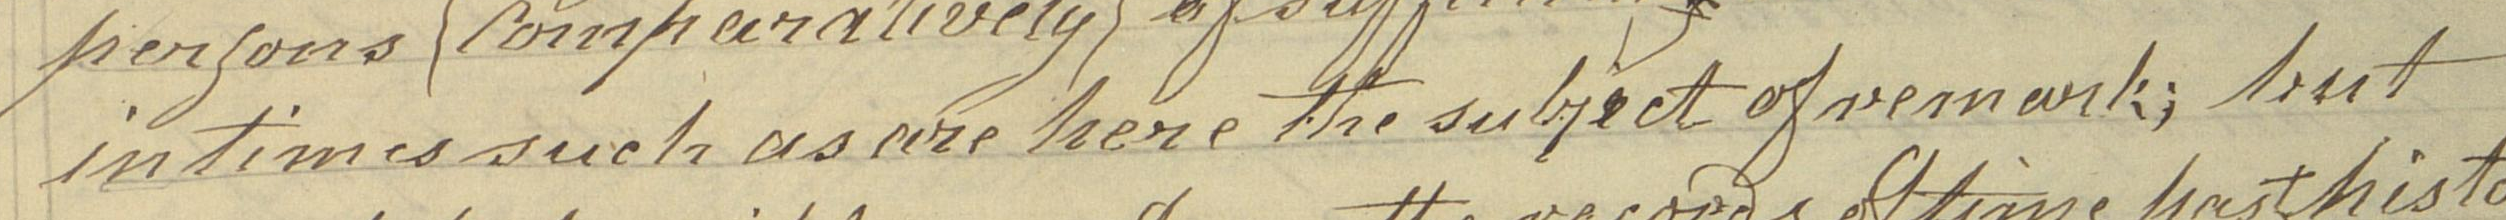in times such as we here the subject of remark; but
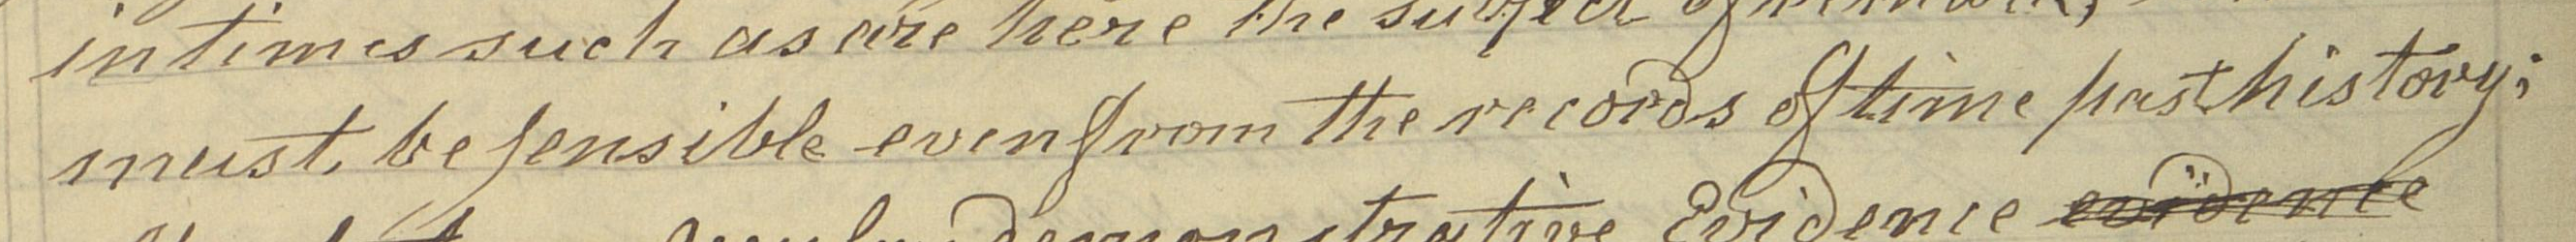must be sensible even from the records of time past history;
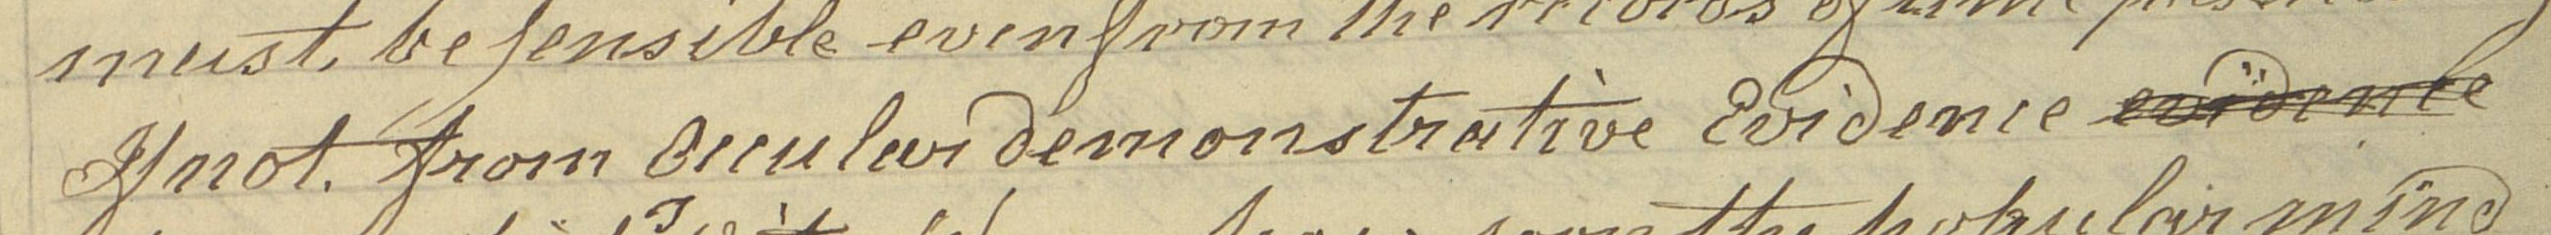If not from Occular demonstrative Evidence evidence
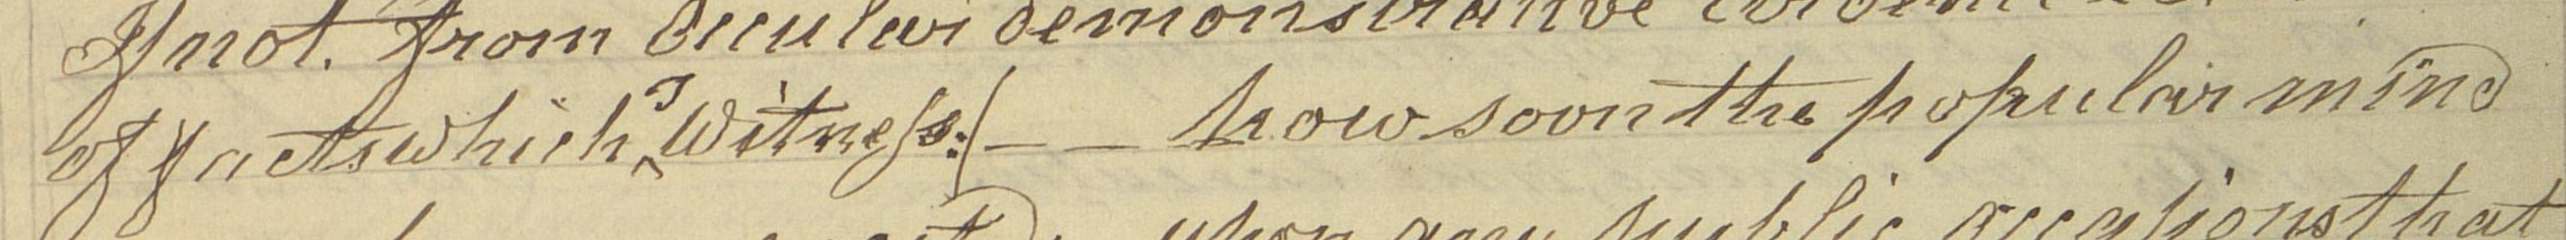of facts which ^ Witness: how soon the popular mind
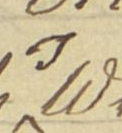I
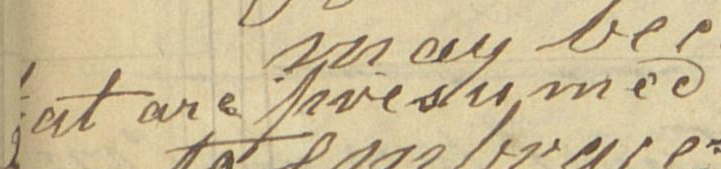at are presumed
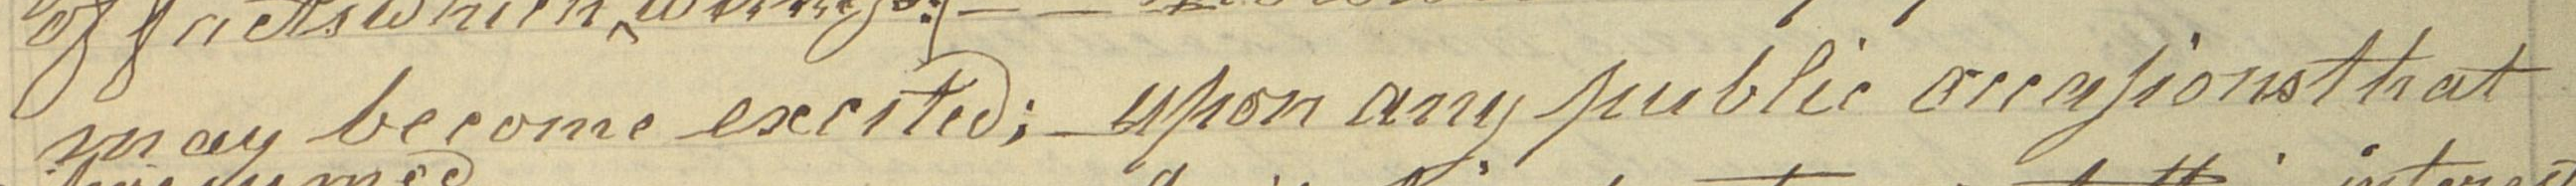may become excited; upon any public occasions that
